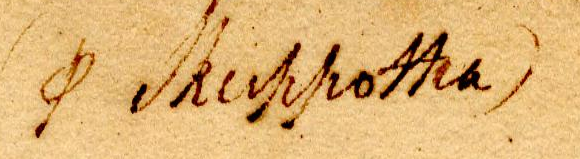(Per Skeppottea)
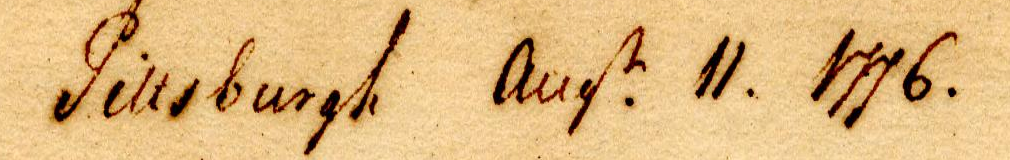Pittsburgh Aug^t. 11. 1776.
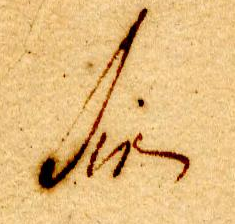Sir
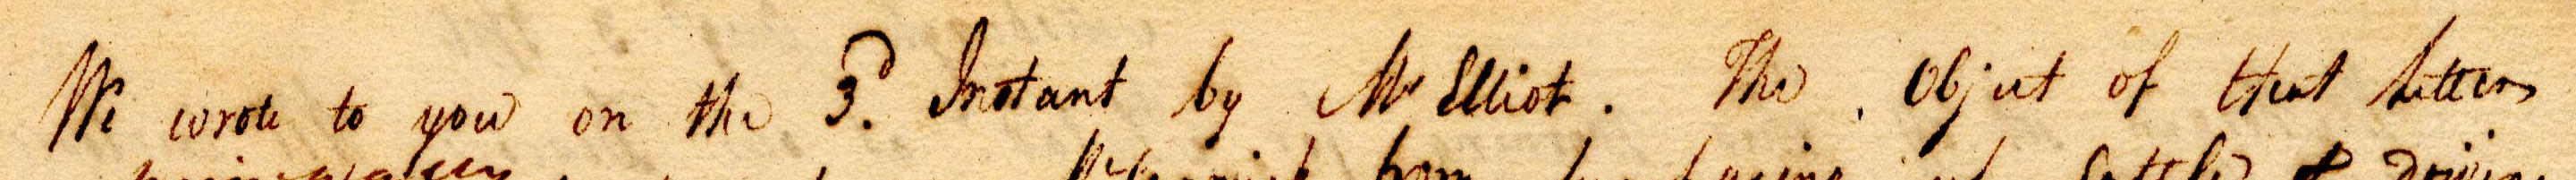We wrote to you on the 3^d. Instant by M^r Elliot. The Object of that Letter
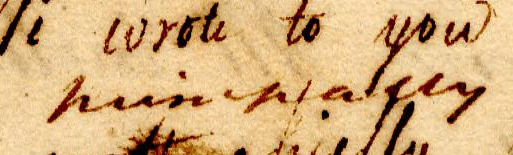principally
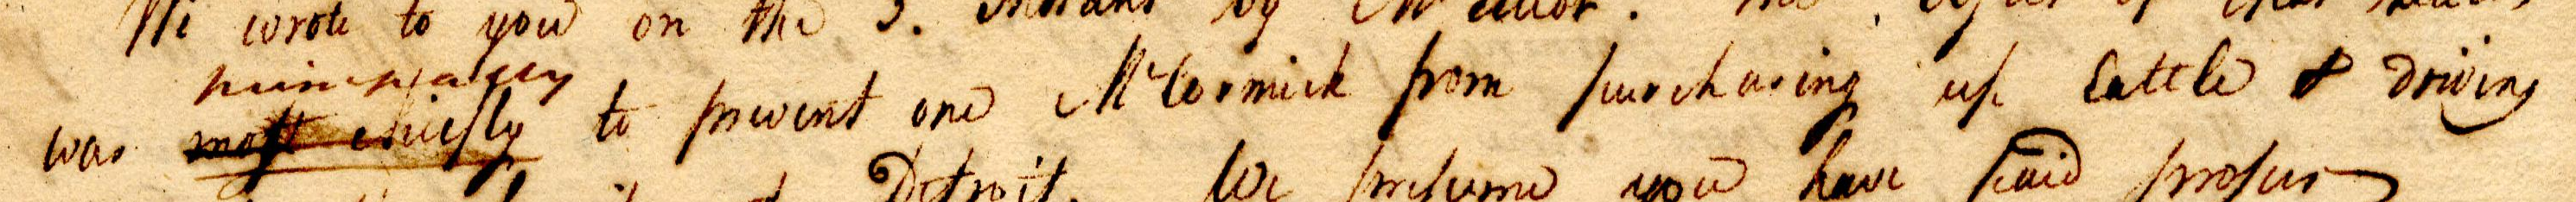was [most chiefly] to prevent one M^cCormick from purchasing up Cattle & driving
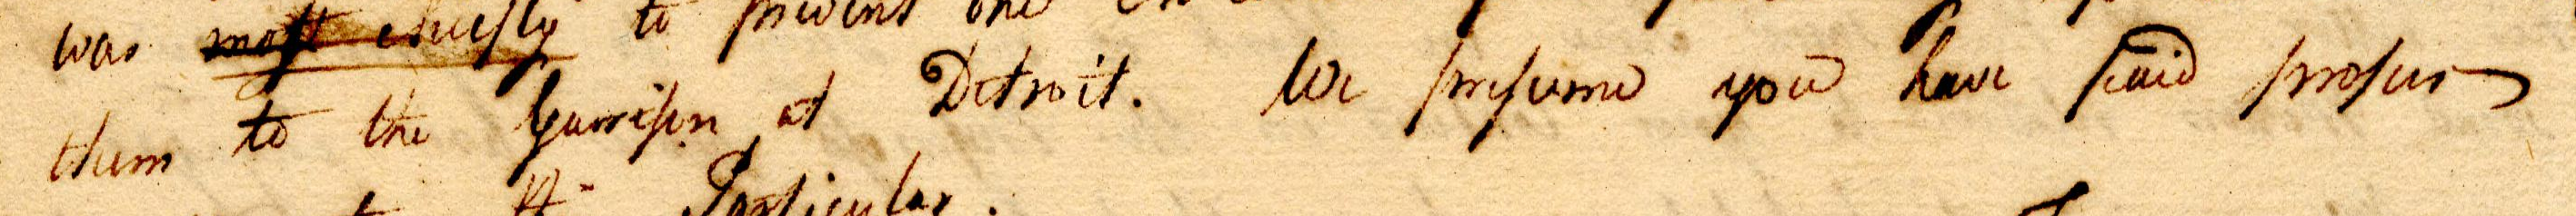them to the Garrison at Detroit. We presume you have paid proper
